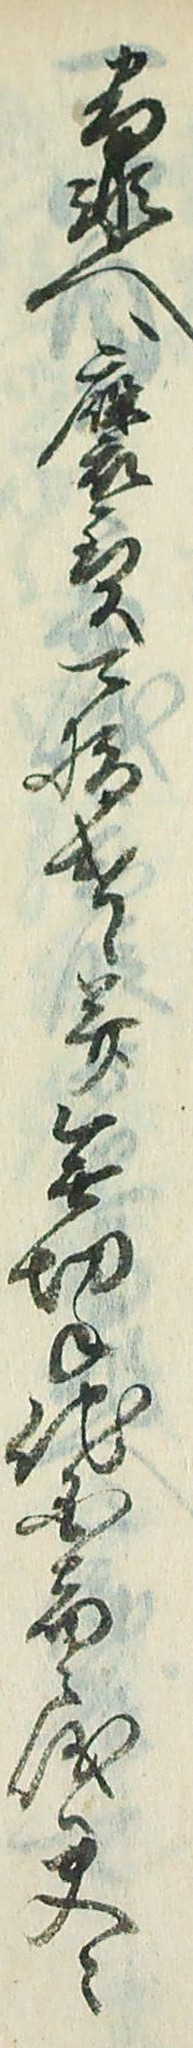番非人へ褒美可指遣候幷無切手他国者之儀ハ夫々
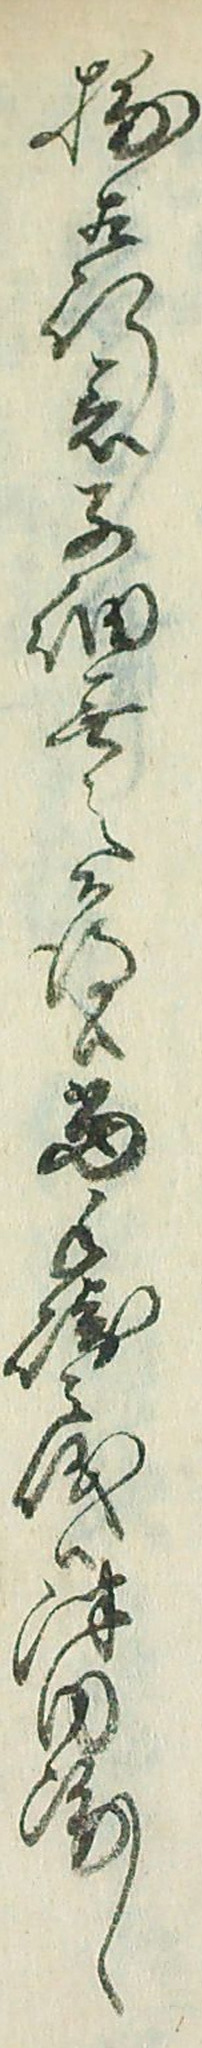捕相行着子細無之候得ハ當手崎之儀ハ津田浦へ
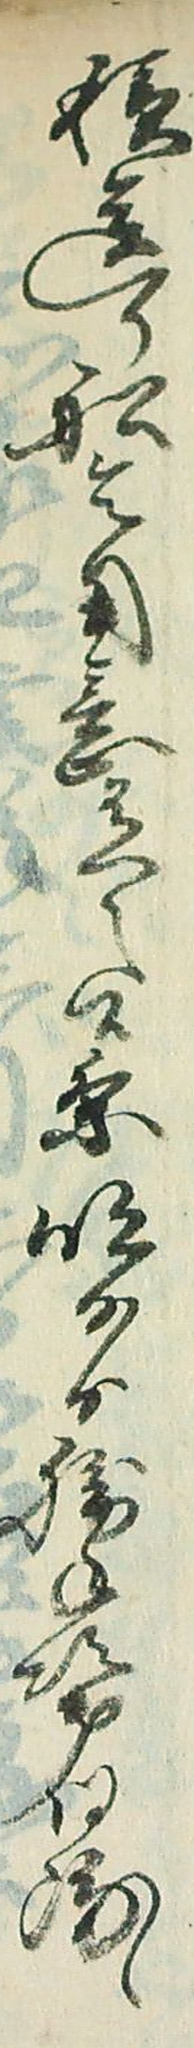積送り舩令用意有之候条明日ゟ勝手次第同浦へ
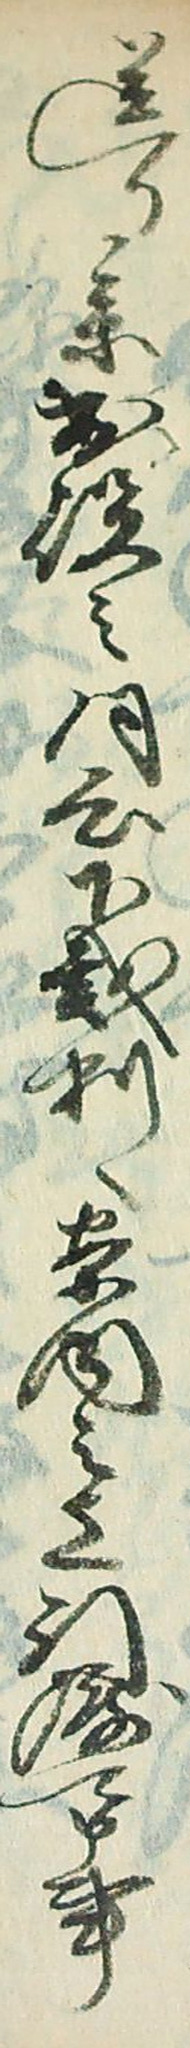送り候条出役之同心下裁判へ案内之上引渡可申事
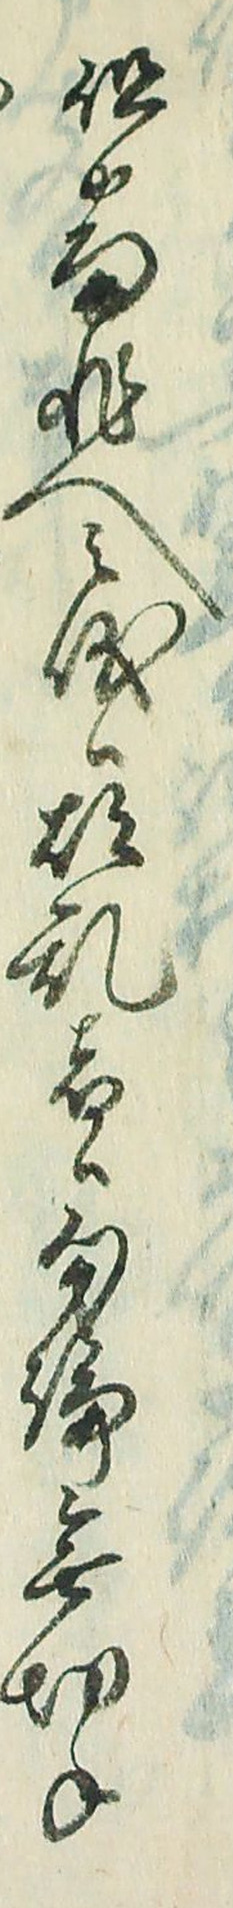但番非人之儀ハ胡乱者ハ勿論無切手
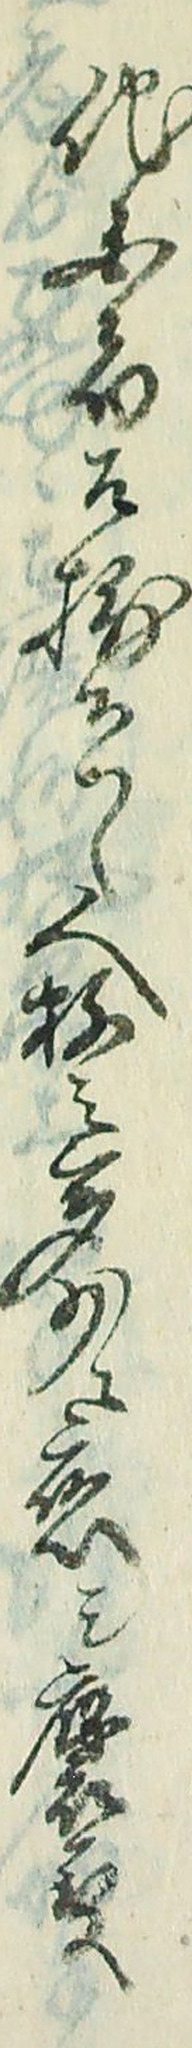他国者召捕候ハヽ人数之多少ニ應シ褒美
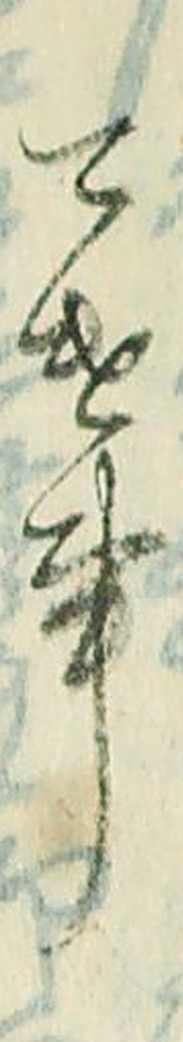可遣事
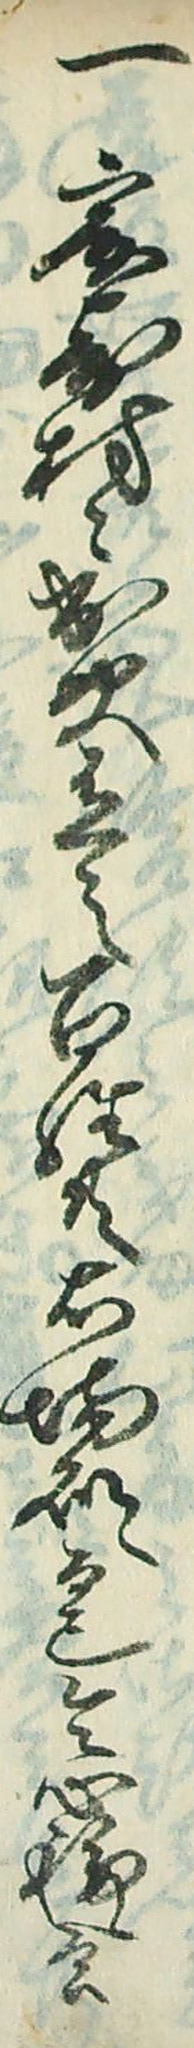一最寄村々出火有之百姓共右場処へ而已令心移候而ハ
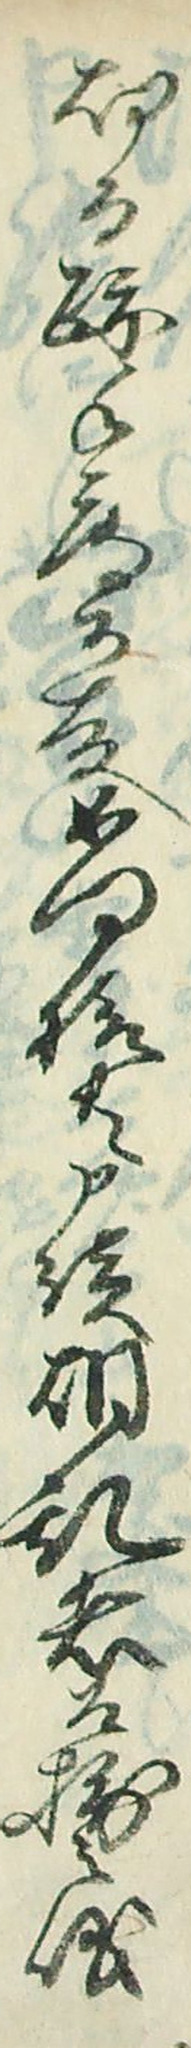却而跡手薄候故如何様共申談胡乱者召捕之儀

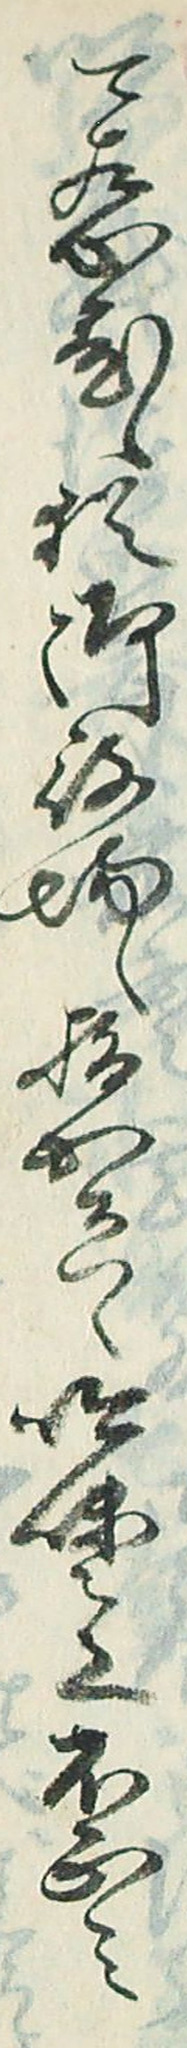可相心懸候猶御役場へ指出候ハヽ吟味之上不正之
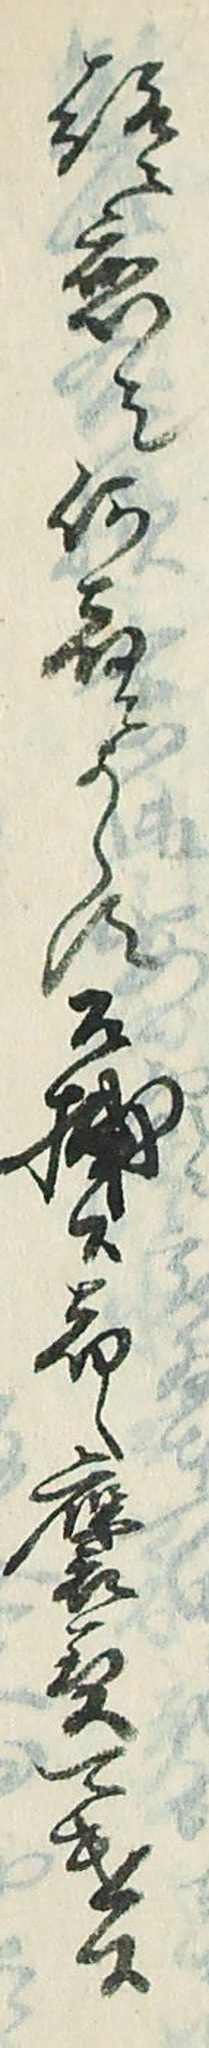趣ニ應シ何者ニよらす召捕候者へ褒美可遣候
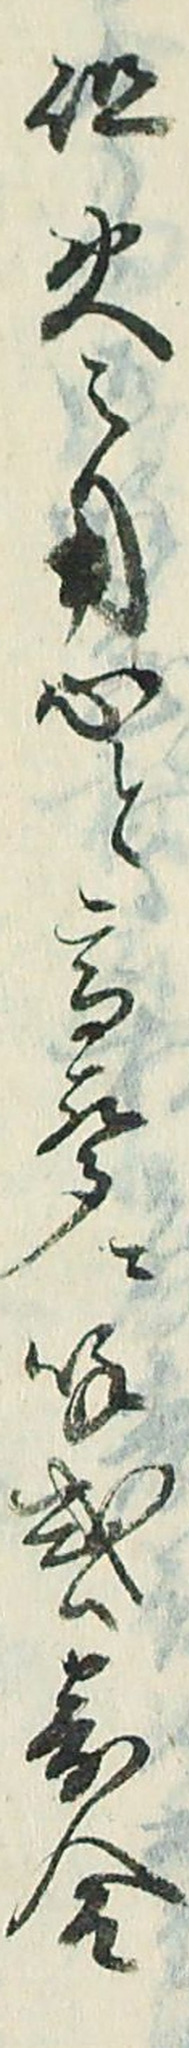但火之用心と高聲ニ呼或ハ寄合
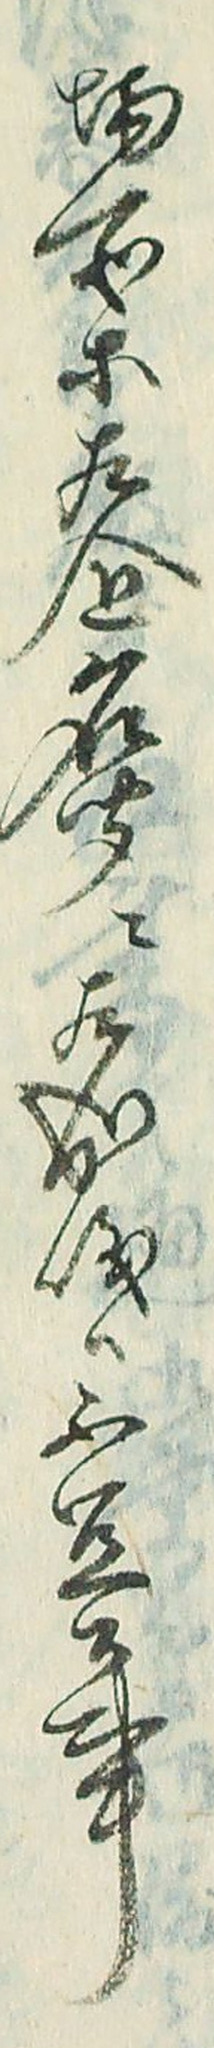場所等相企名聞ニ相成儀ハ不宜候事
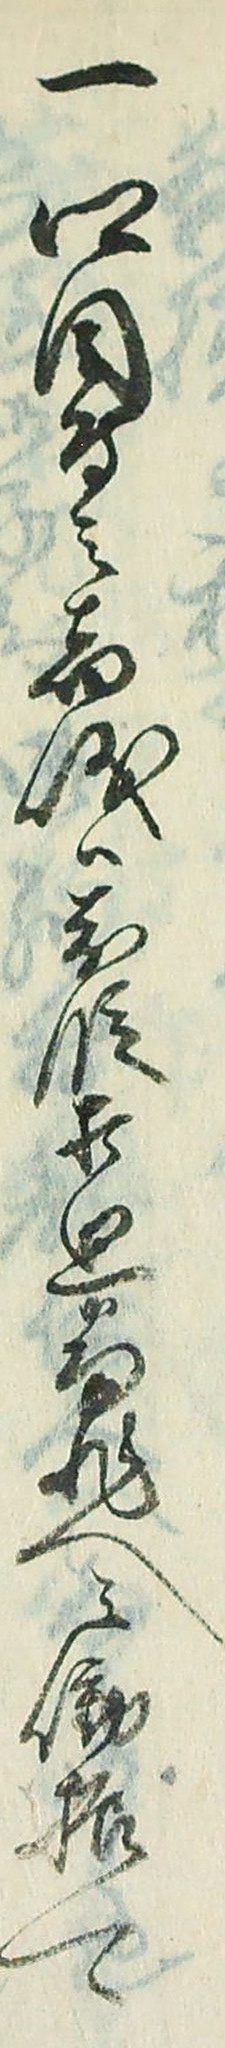一郷目付之者儀ハ別段打廻番非人之働振可
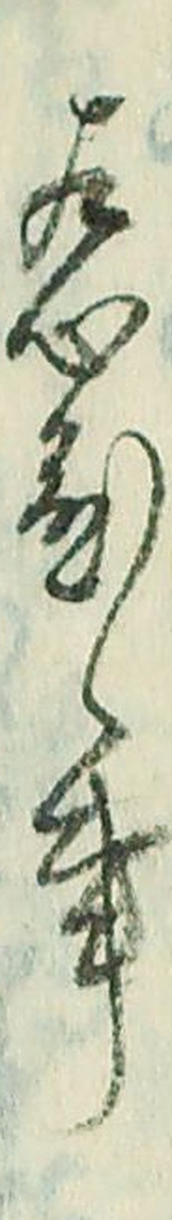相心懸候事
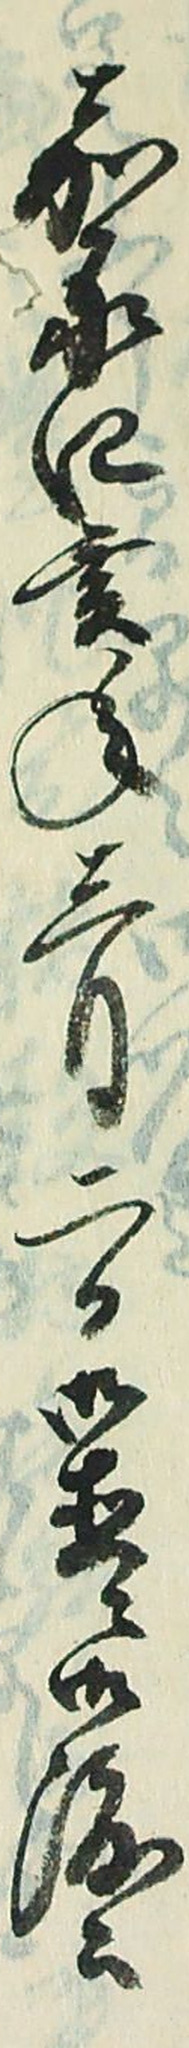嘉永四亥年十二月二日御直ニ御渡被
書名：諸御趣意書并御下知向之写
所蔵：鳴門教育大学 Naruto University of Education
